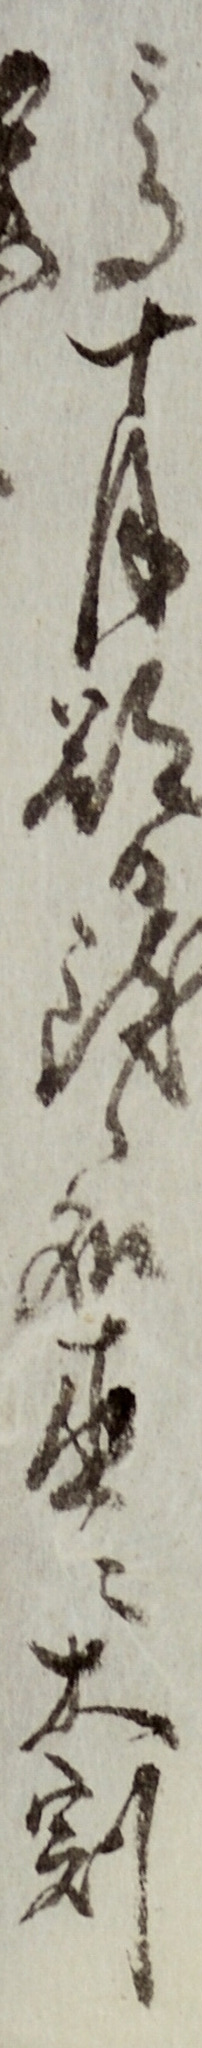ニ而十月朔日致候処直ニ大割

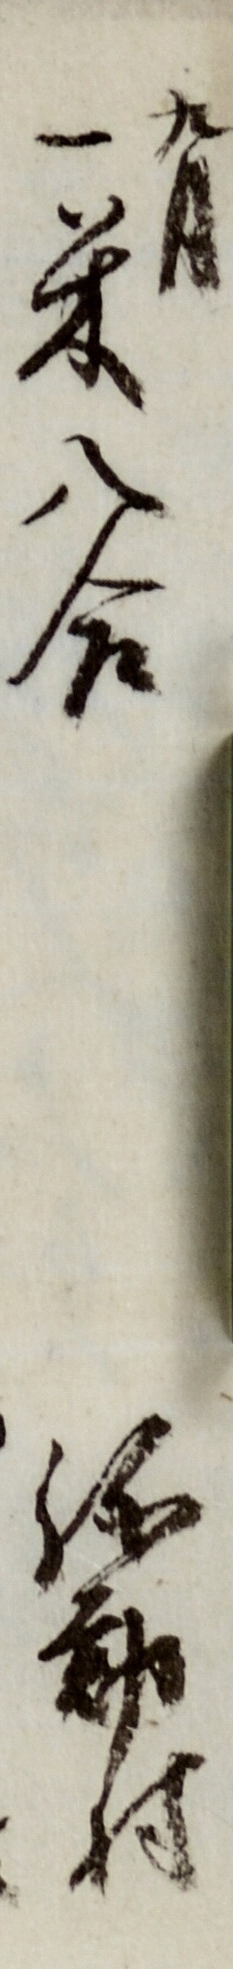一米八合弥勒村
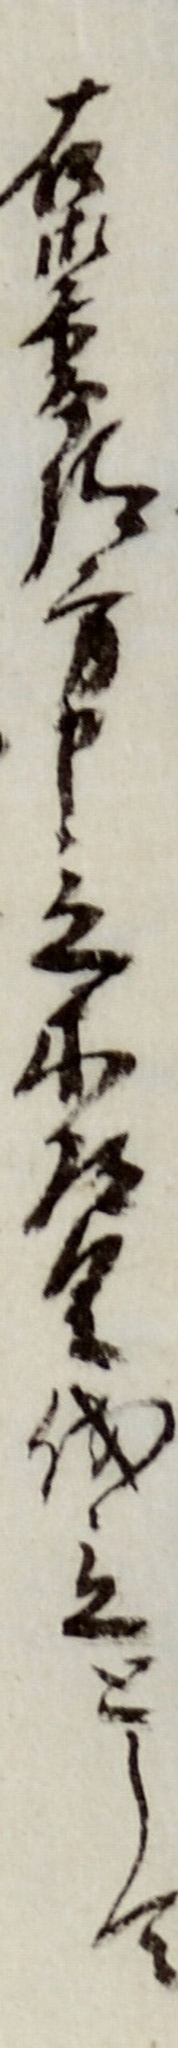右御普請方申立木道具伐立として
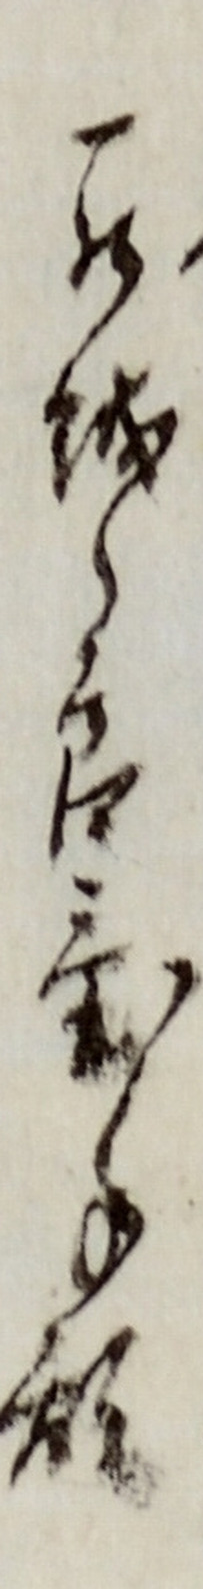罷越候節置手形
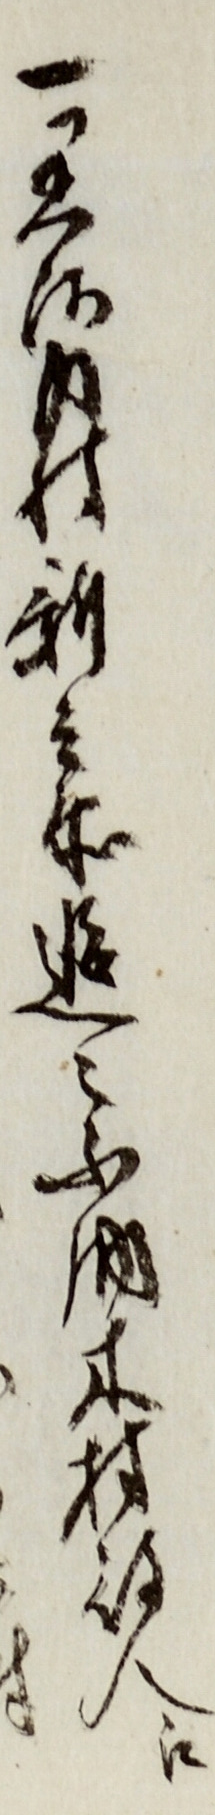一黒河内村新兵衛追々不納木村役人江
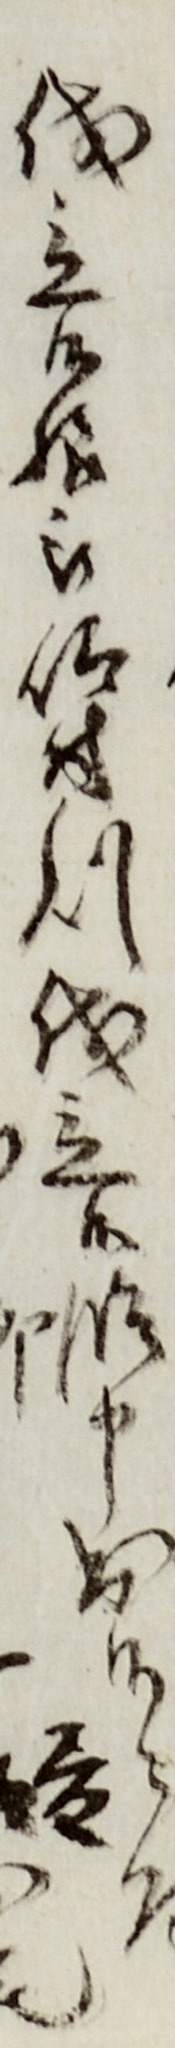伐立候様被仰付則伐立候段申出候ニ付
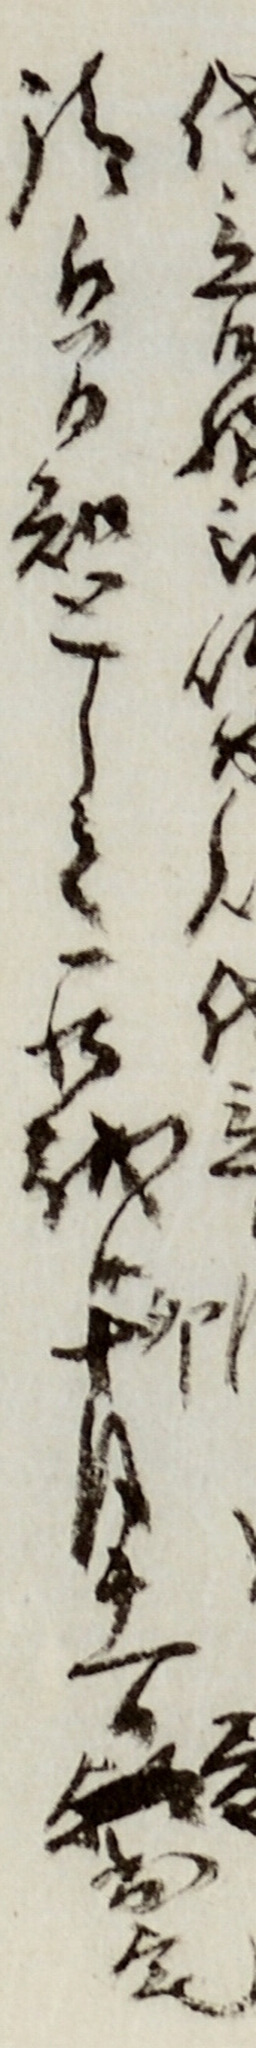請取間知として罷越候卯十月十一日昼出宅
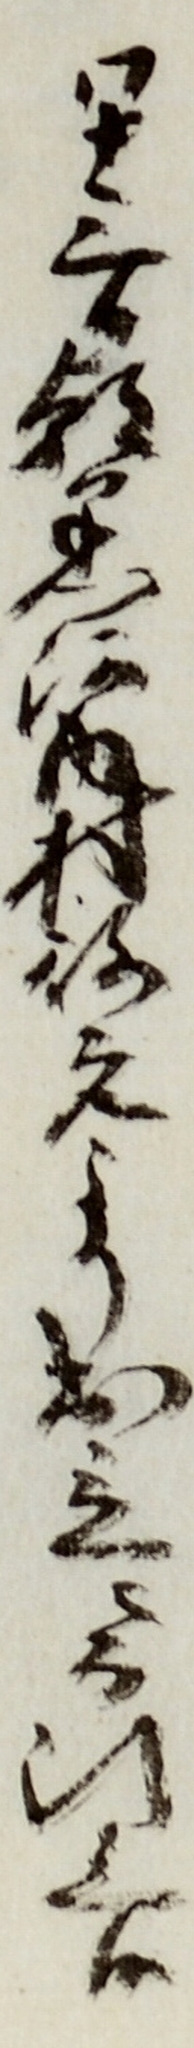同十三日朝黒河内村役元より出立二而引上候
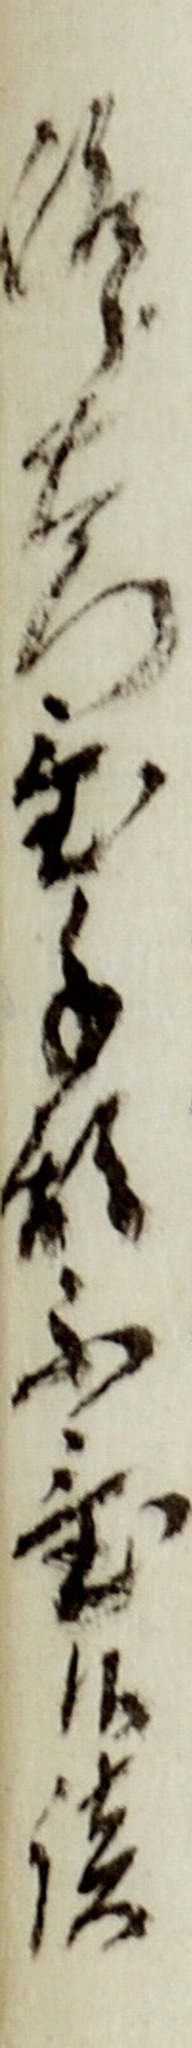治郎右衛門置手形不置候談
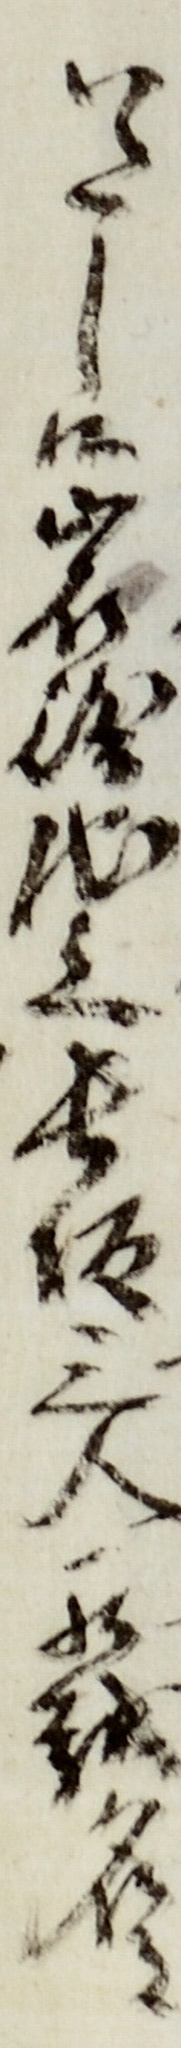いたし候岩崎池上長坂三人罷越名主
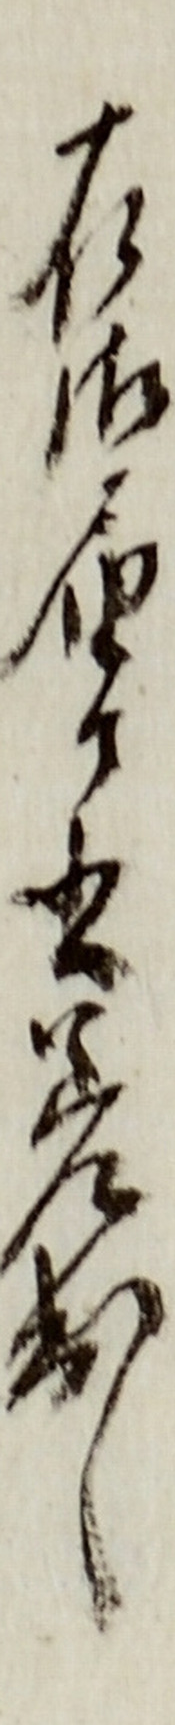右御届ケ書差出候

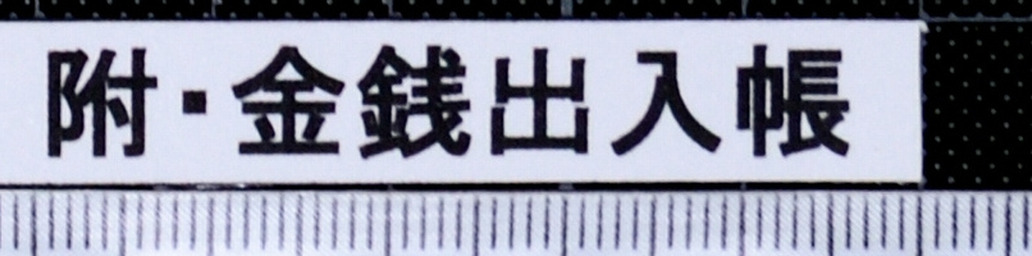金銭出入帳

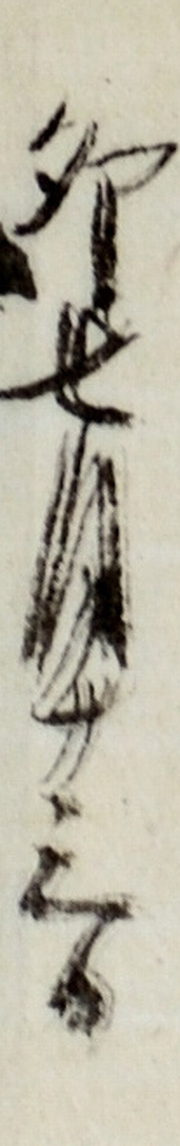卯七月十三日
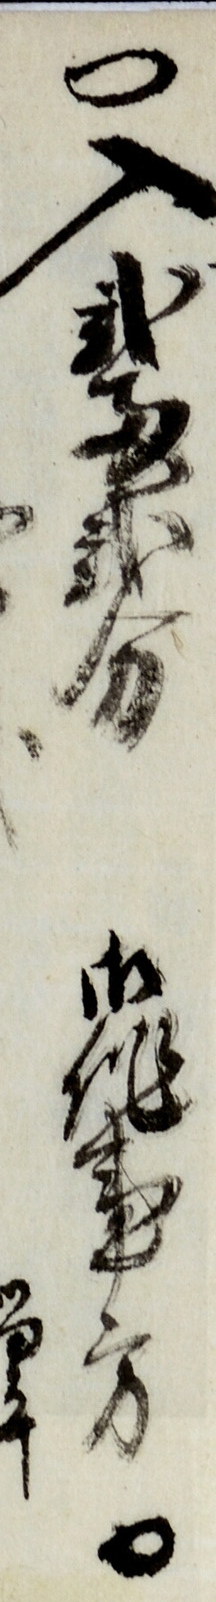〇入弐両二分御作事方〇
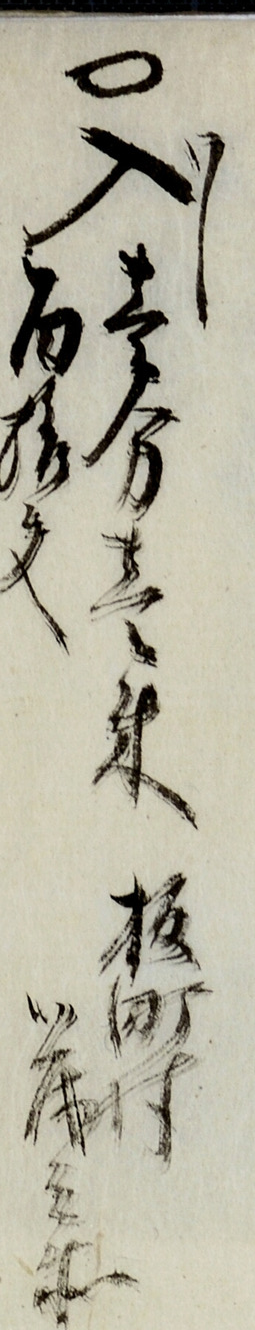〇入壱分壱朱板町村
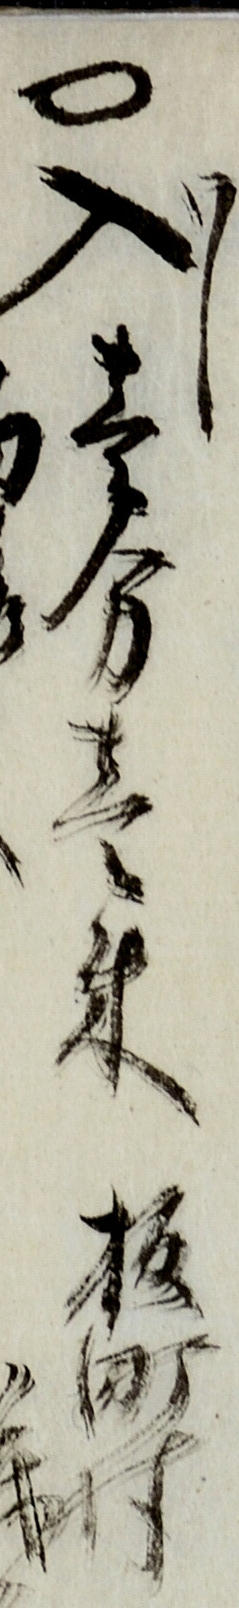〇入壱分壱朱板町村
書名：中沢郷御竹薮見廻り
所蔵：伊那市立高遠町図書館・合同会社AMANE
